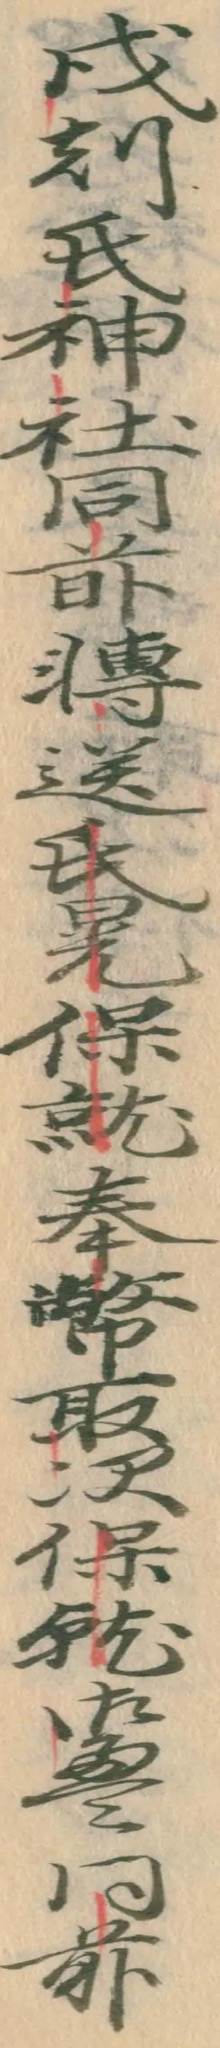戌_刻氏_神_社同-前転-送氏晃保就奉-幣取_次保就御畳同-前
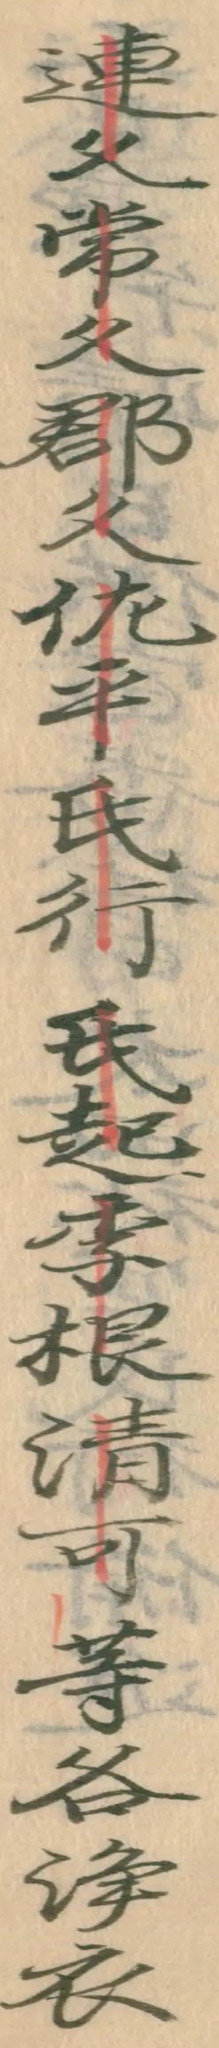連久常久郡久佐平氏行氏起季根清可_等各浄衣
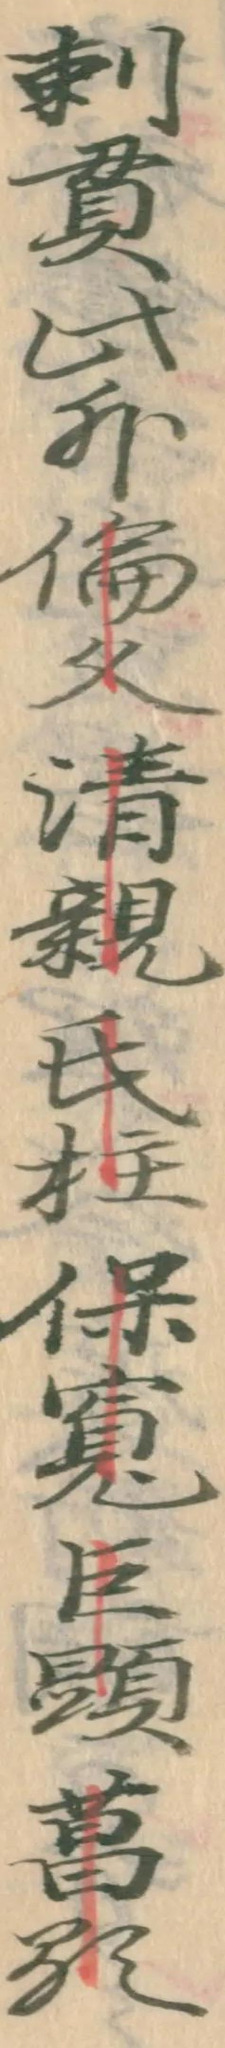刺貫此外倫久清親氏柱保寛巨頭菖顕
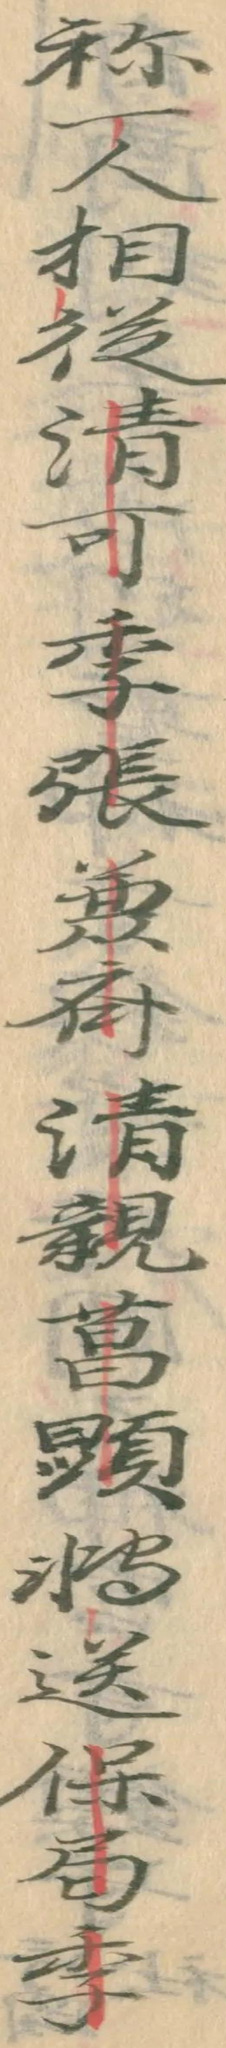祢一-人相_従清可季張兼斎清親菖顕伝-送保局季
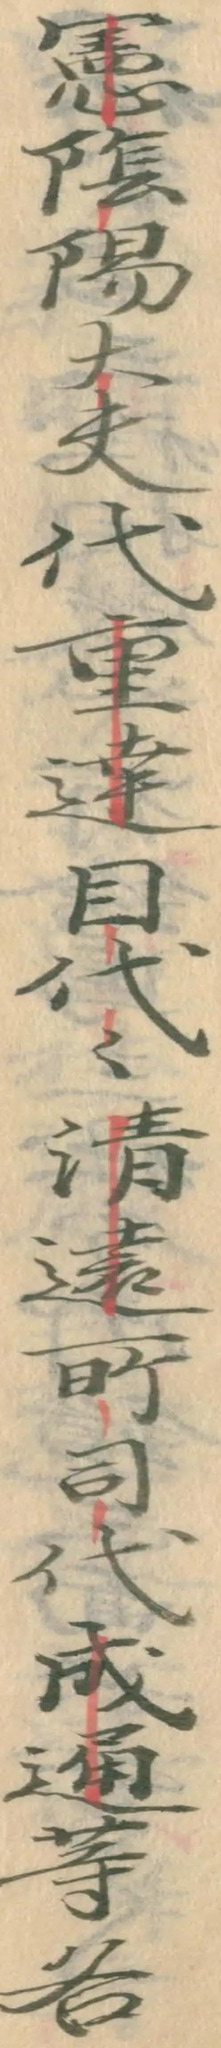憲陰-陽大-夫代重達目-代-々清遠所-司-代成通等各

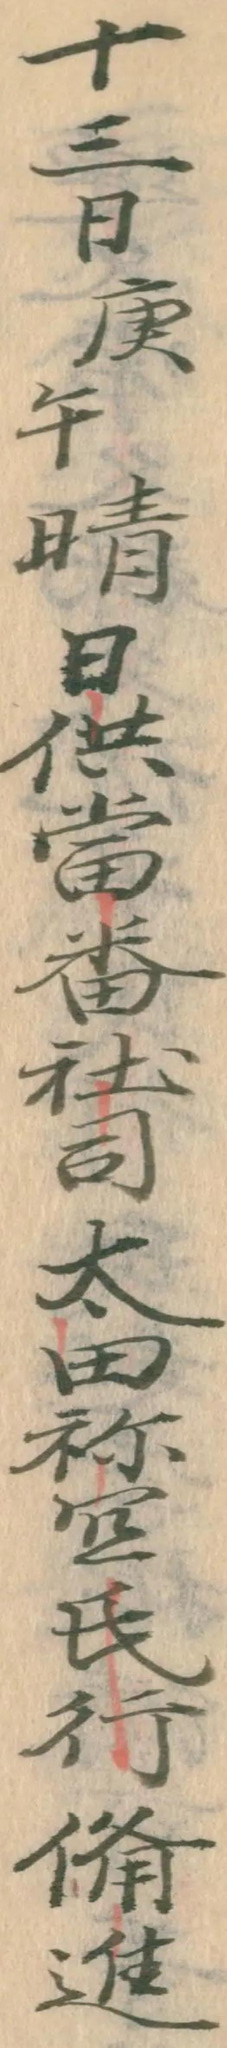十三日庚午晴日-供当-番社-司太_田祢-宜氏行備-進
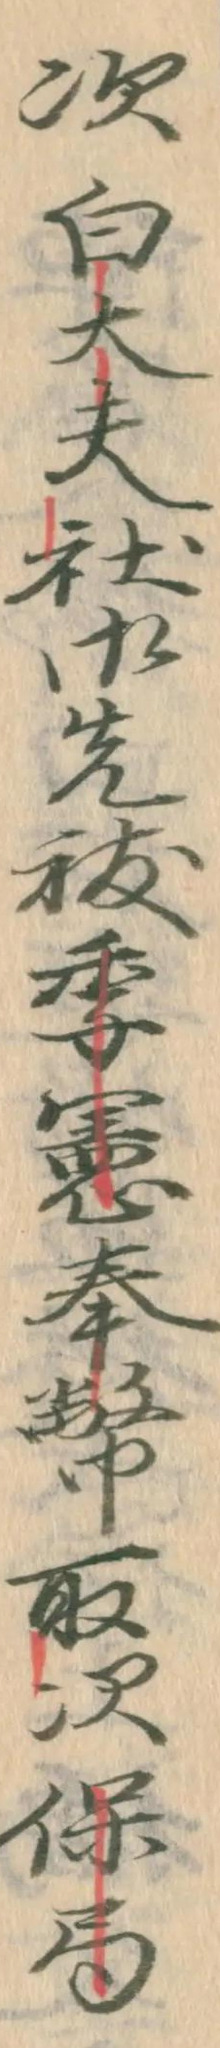次白-大-夫_社御先祓季憲奉-幣取_次保局
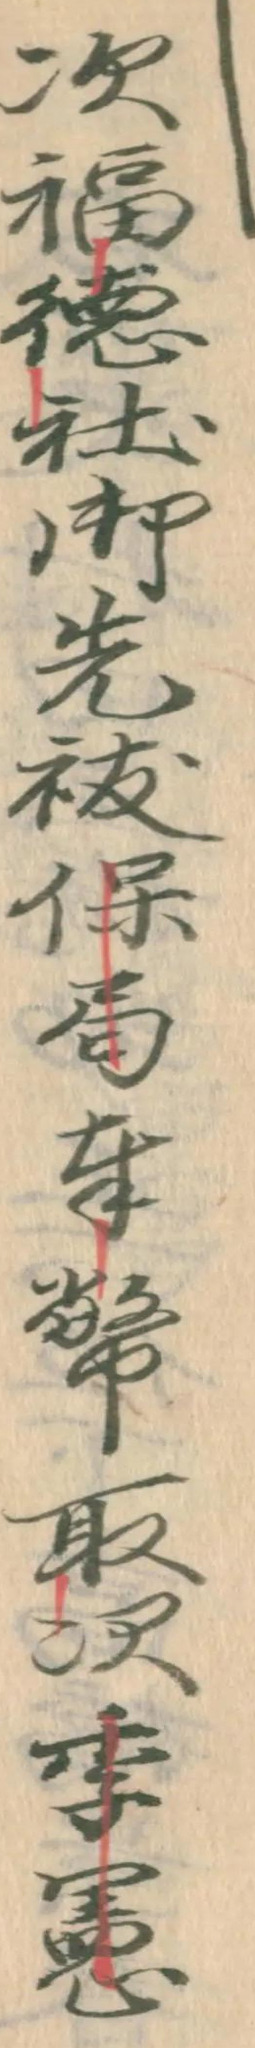次福-徳_社御先祓保局奉-幣取_次季憲
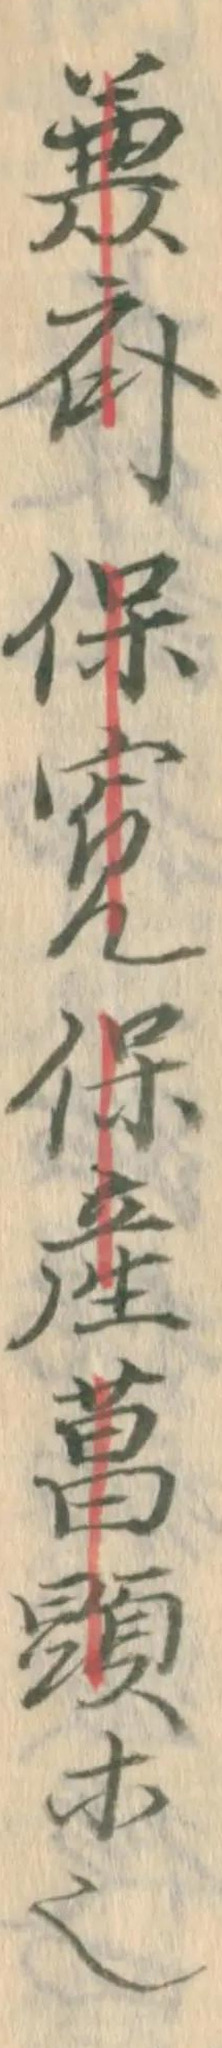兼斉保寛保産菖顕等也

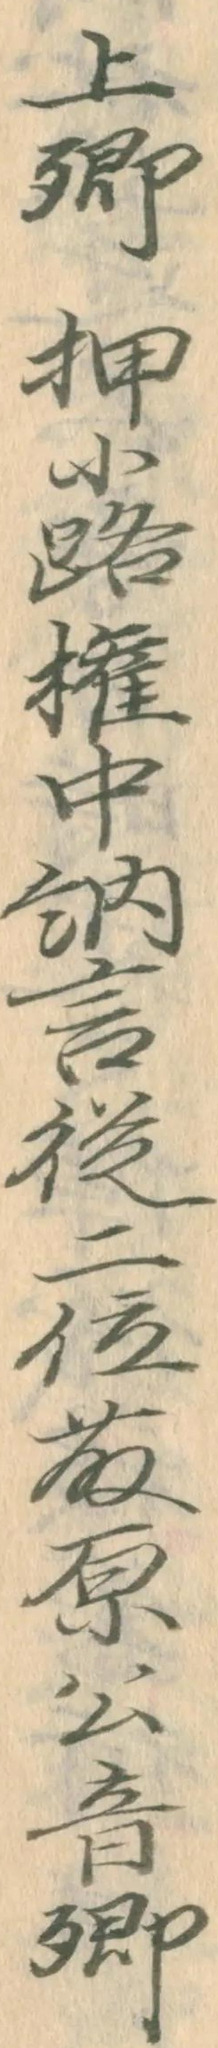上卿押小路権中納言従二位藤原公音卿
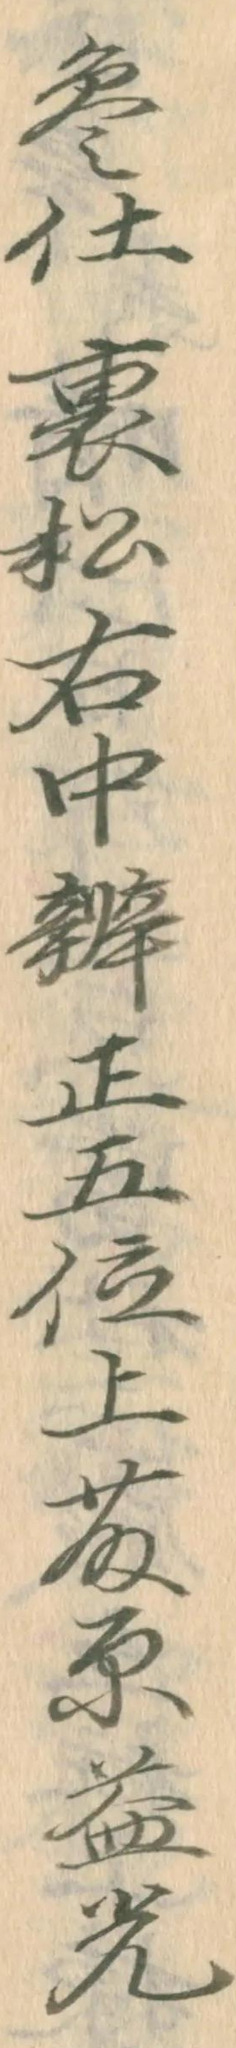参仕裏松右中弁正五位上藤原益光
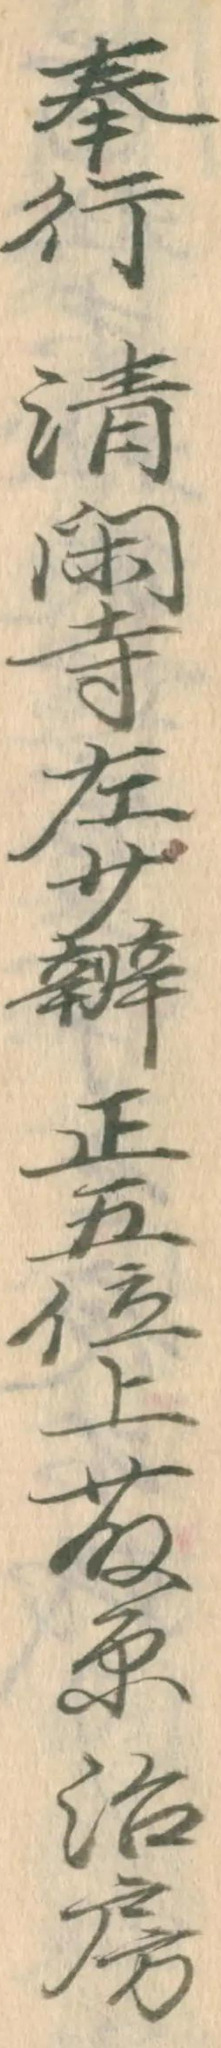奉行清閑寺左少弁正五位上藤原治房
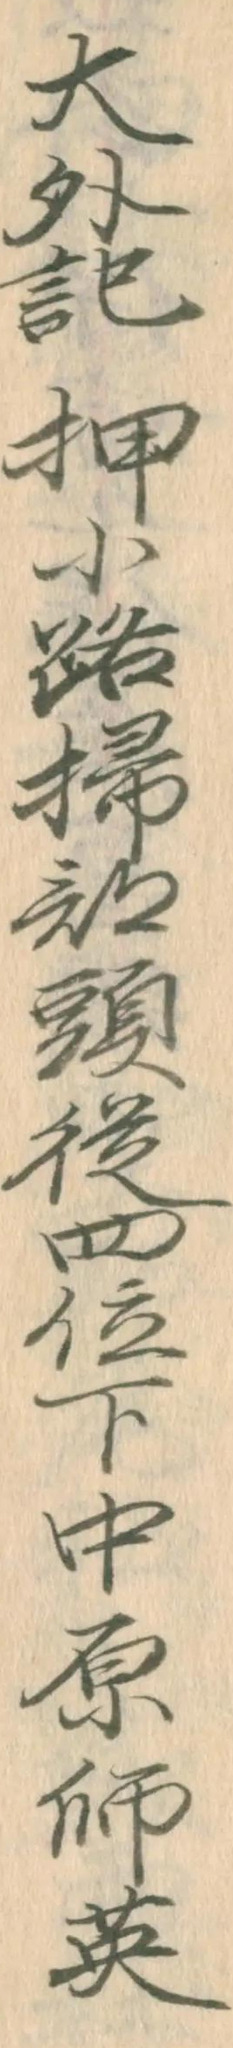大外記押小路掃部頭従四位下中原師英
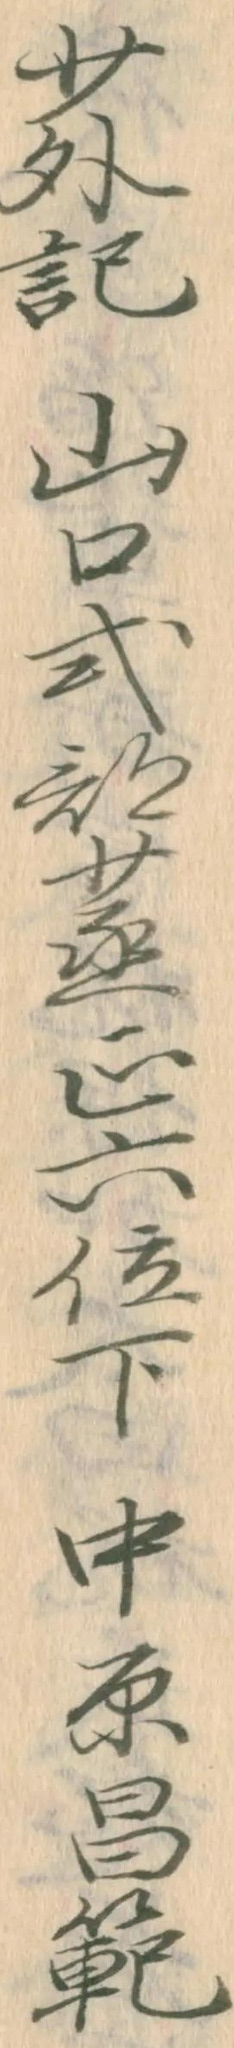少外記山口式部少丞正六位下中原昌範
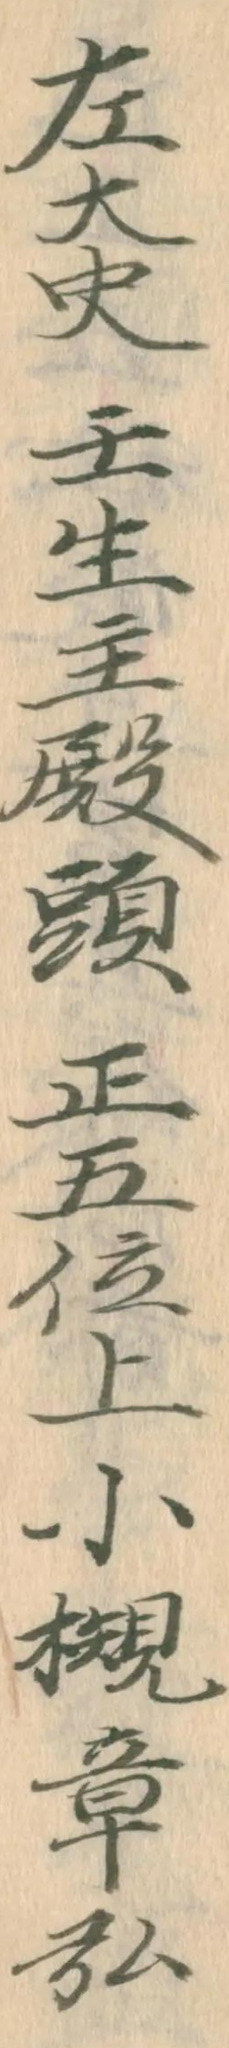左大史壬生主殿頭正五位上小槻章弘
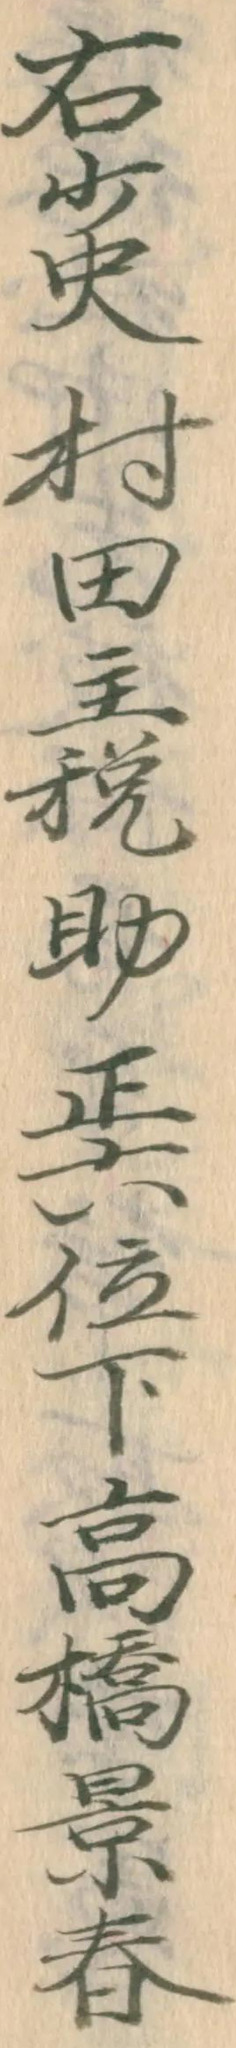右少史村田主税助正六位下高橋景春
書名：賀茂社記録. 第16冊
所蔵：国立国会図書館 National Diet Library, JAPAN
